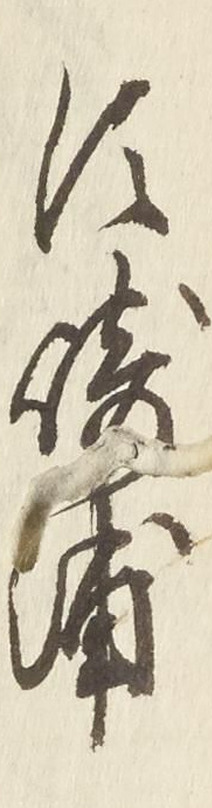須崎浦
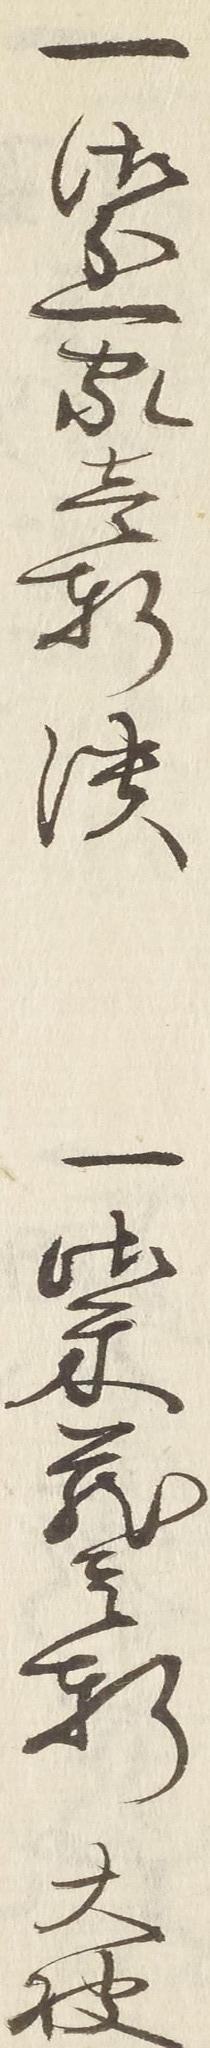一御分一家壱軒潰一御米蔵壱軒大破
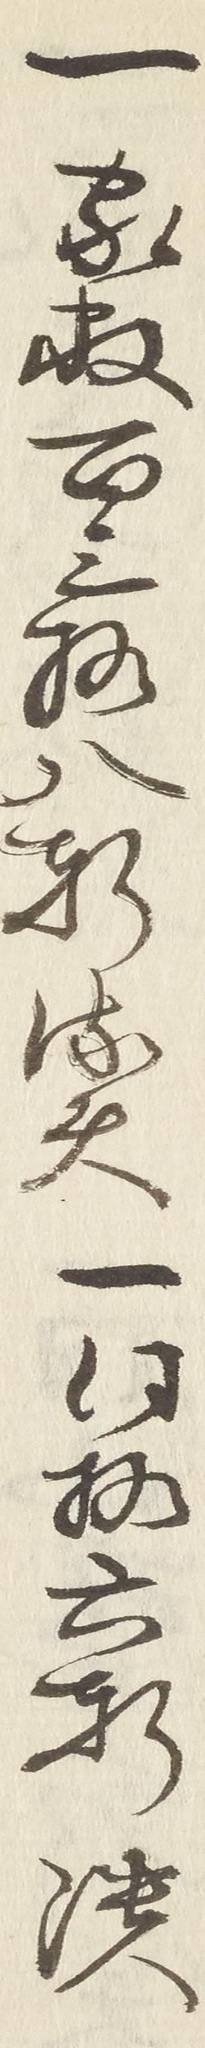一家数百三拾八軒流失一同拾六軒潰
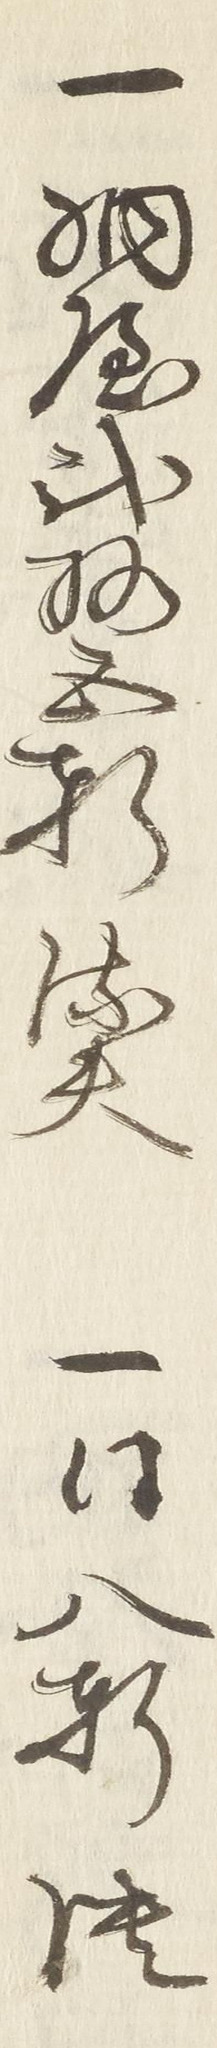一納屋弐拾五軒流失一同八軒潰
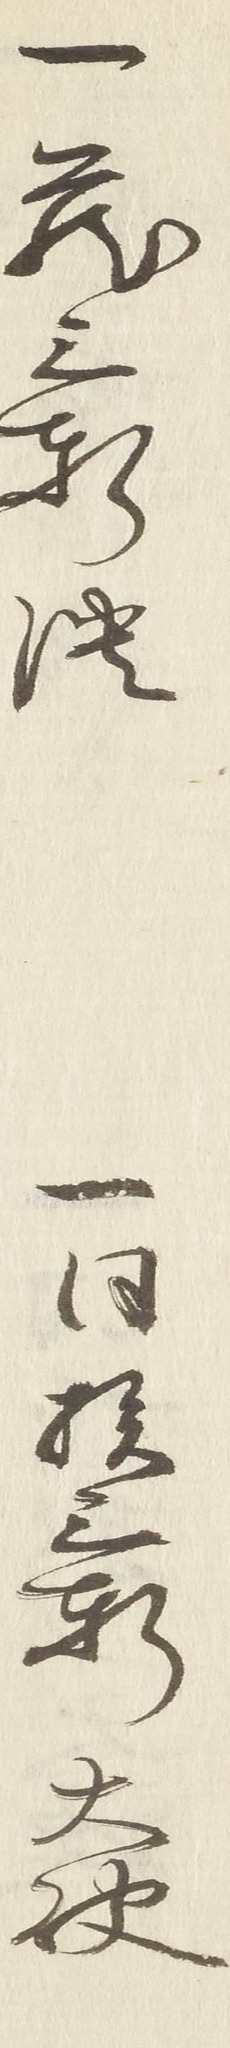一蔵三軒潰一同拾三軒大破
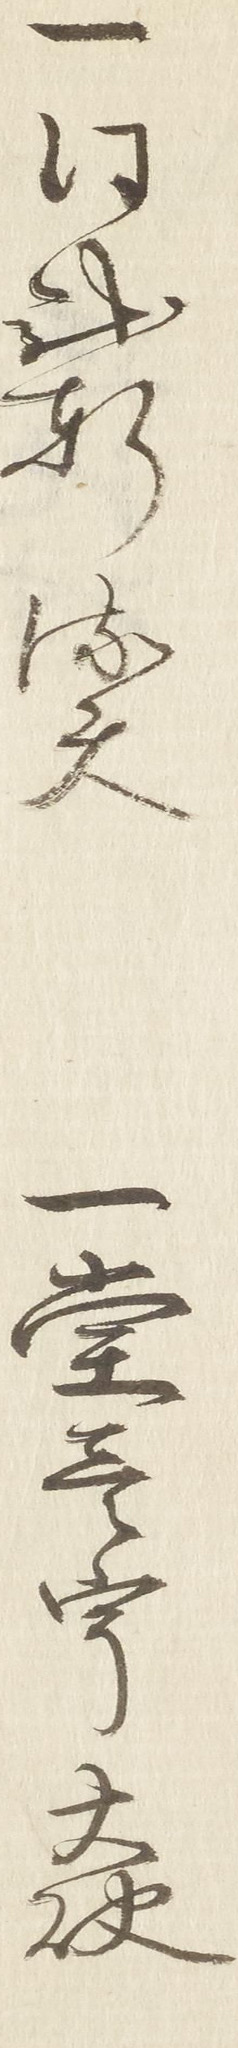一同弐軒流失一堂壱宇大破
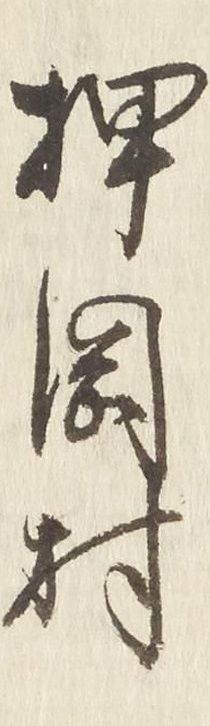押岡村
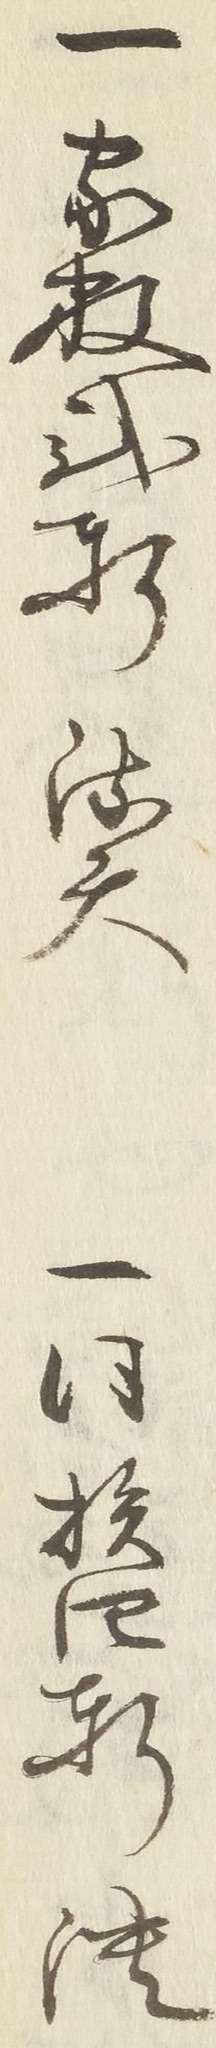一家数弐軒流失一同拾四軒潰
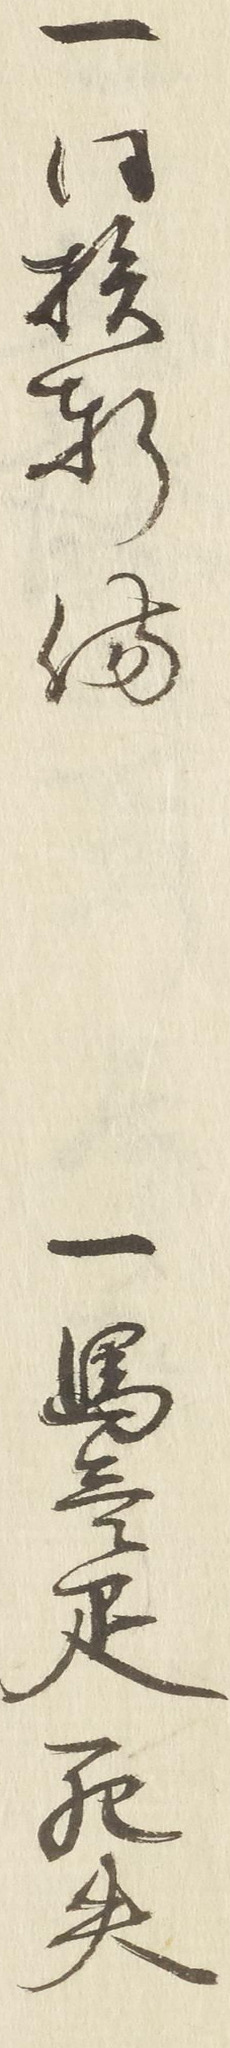一同拾軒傷一馬壱疋死失

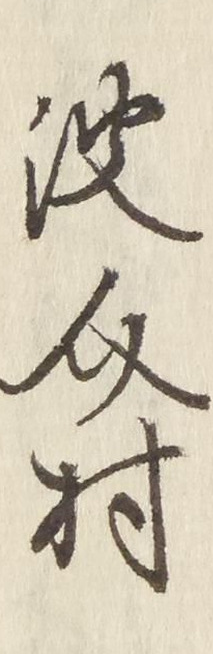波介村
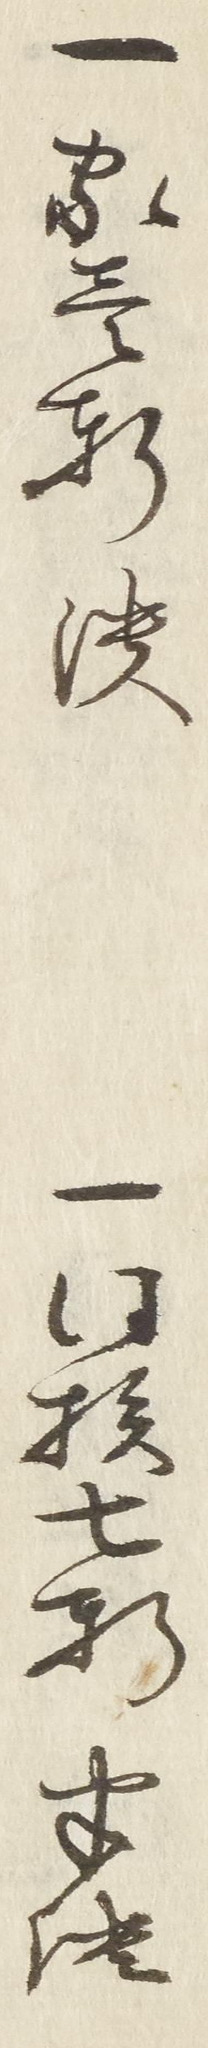一家壱軒潰一同拾七軒半潰
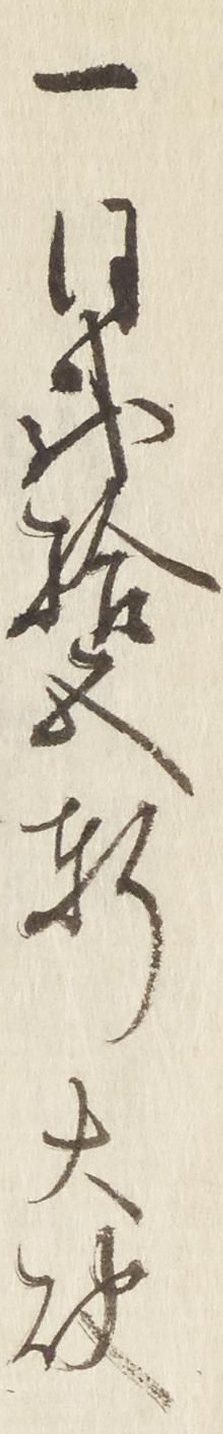一同弐拾五軒大破
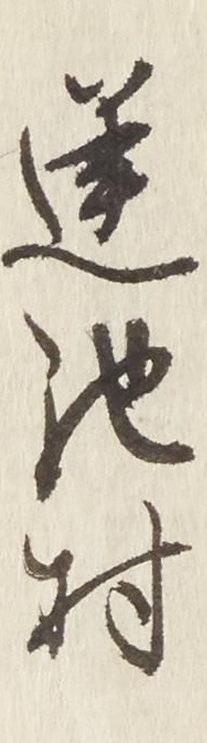蓮池村
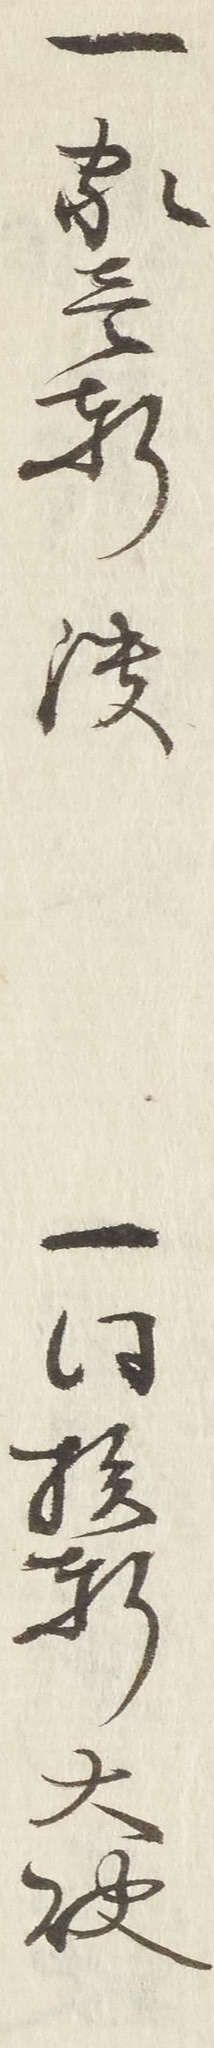一家壱軒潰一同拾軒大破
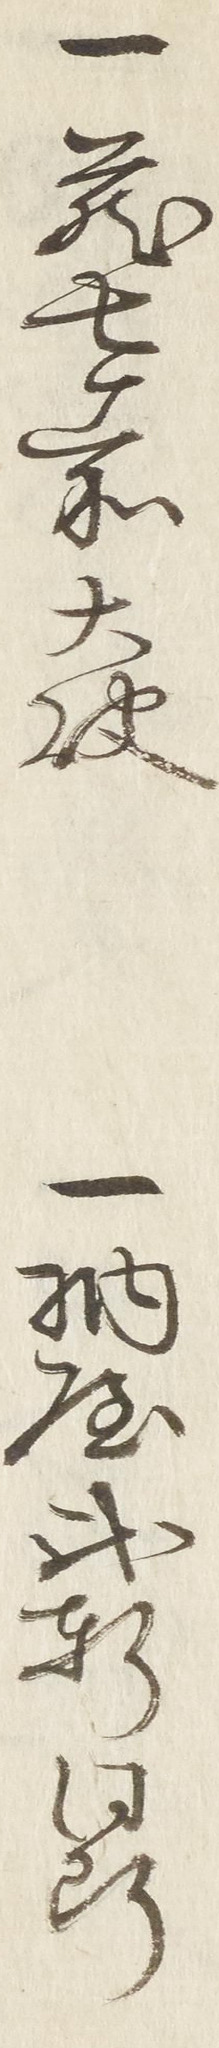一蔵七ヶ所大破一納屋弐軒同断
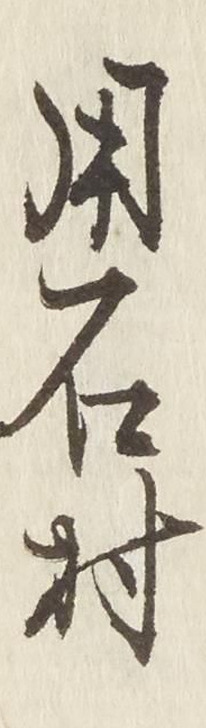用石村
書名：地震記　下
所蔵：東京大学地震研究所図書室 Earthquake Research Institute Library, The University of Tokyo, JAPAN
